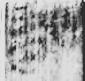○（荆）
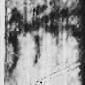𫵖
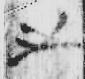之
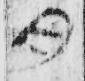月
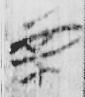辛
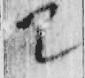巳
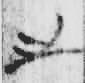之
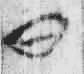日
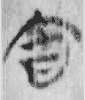缶
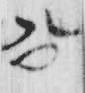公
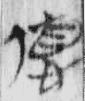德
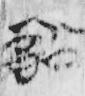訟
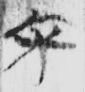宋
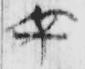宋
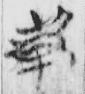庚
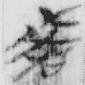差
